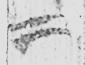二
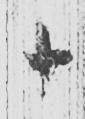十
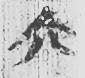六
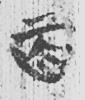百
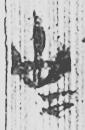卅=
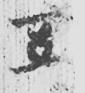五
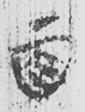百
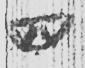四
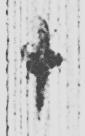十
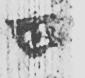四
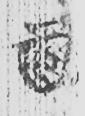百
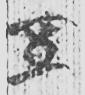五
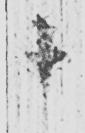十
